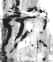凥（居）
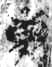東
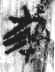南
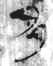多
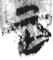○（基）
